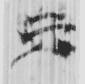亓
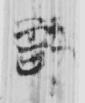信
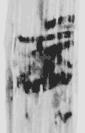者
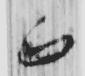㠯（以）
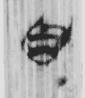自
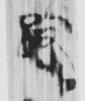攺
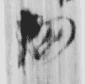則
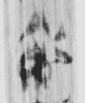{化心}
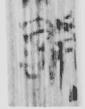{言㡀}
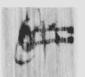母
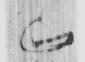㠯（以）
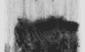一
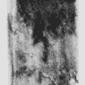人
